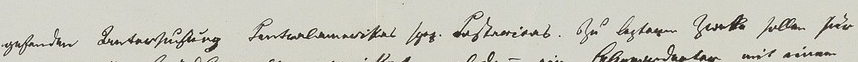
gehenden Untersuchung Centralamerikas spez. Costaricas. Zu lezterm Zweke sollen für
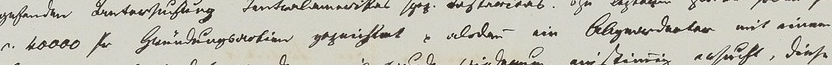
c. 40000 fr Gründungsactien gezeichnet & alsdann ein Abgeordneter mit einem
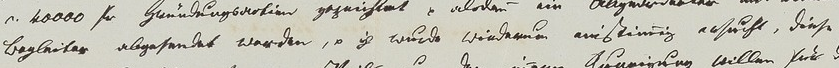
Begleiter abgesendet werden, & ich wurde wiederum einstimmig ersucht, diese
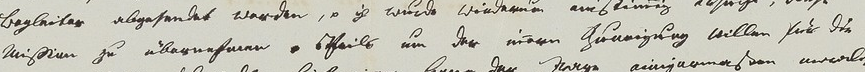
Mission zu übernehmen. Theils um der innern Zuneigung willen für die
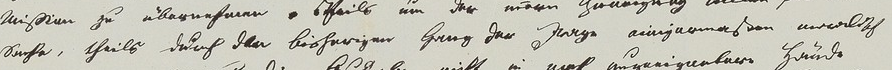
Sache, theils durch den bisherigen Gang der Frage einigermaßen moralisch
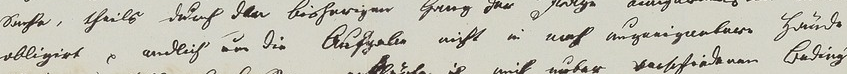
obligirt & endlich um die Aufgabe nicht in noch ungeeignetere Hände
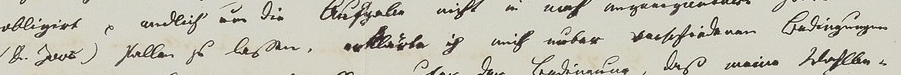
(Dr. Joos ) fallen zu lassen, erklärte ich mich unter verschiedenen Bedingungen
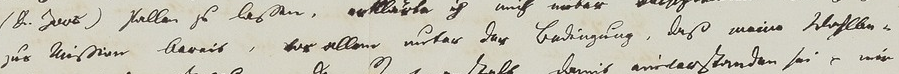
zur Mission bereit, vor allem unter der Bedingung, daß meine Wahlbe-
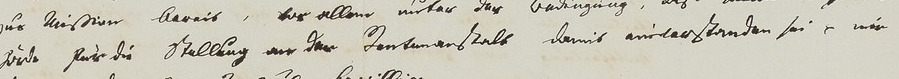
hörde für die Stellung an der Rentenanstalt damit einverstanden sei & mir
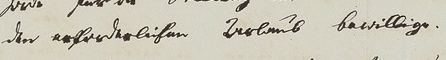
den erforderlichen Urlaub bewillige.
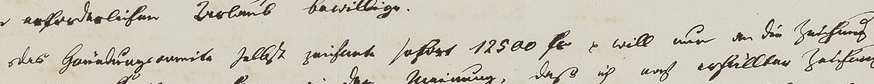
Das Gründungscomite selbst zeichnete sofort 12500 fr & will nun an die Zeichnung
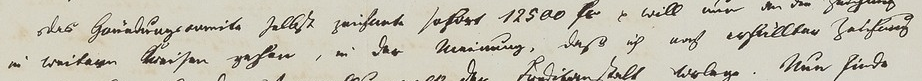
in weitern Kreisen gehen, in der Meinung, daß ich nach erfüllter Zeichnung
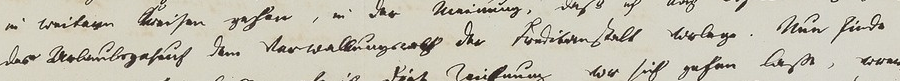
das Urlaubsgesuch dem Verwaltungsrath der Creditanstalt vorlege. Nun finde
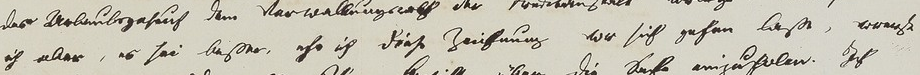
ich aber, es sei besser, ehe ich diese Zeichnung vor sich gehen lasse, vorerst
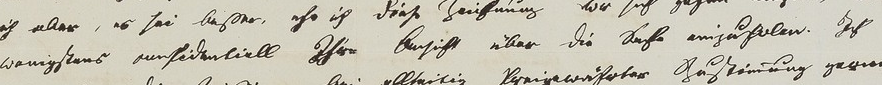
wenigstens confidentiell Ihre Ansicht über die Sache einzuholen. Ich
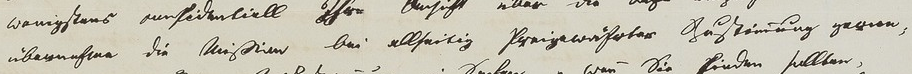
übernehme die Mission bei allseitig freigewährter Zustimmung gerne,
